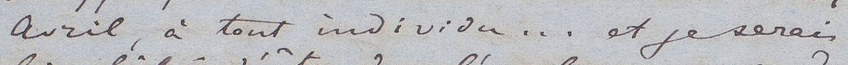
Avril, à tout individu.. . et je serais
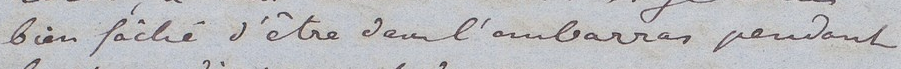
bien fâché d'être dans l'embarras pendant
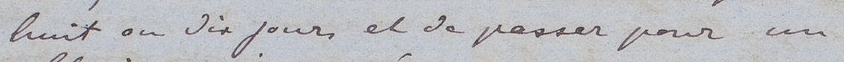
huit ou dix jours et de passer pour un
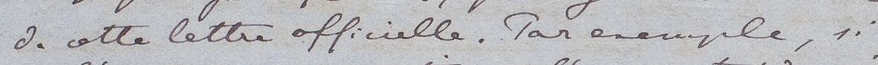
de cette lettre officielle. Par exemple, si
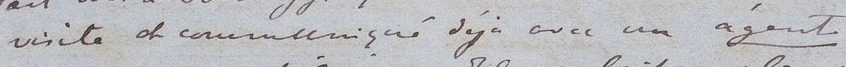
visite et communiqué déja avec un agent
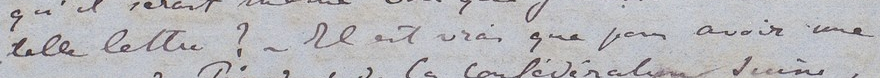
telle lettre? – Il est vrai que pour avoir une
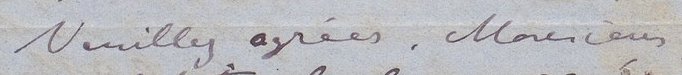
Veuillez agréer, Monsieur,
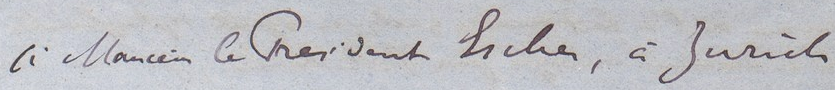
À Monsieur le President Escher, à Zurich.
